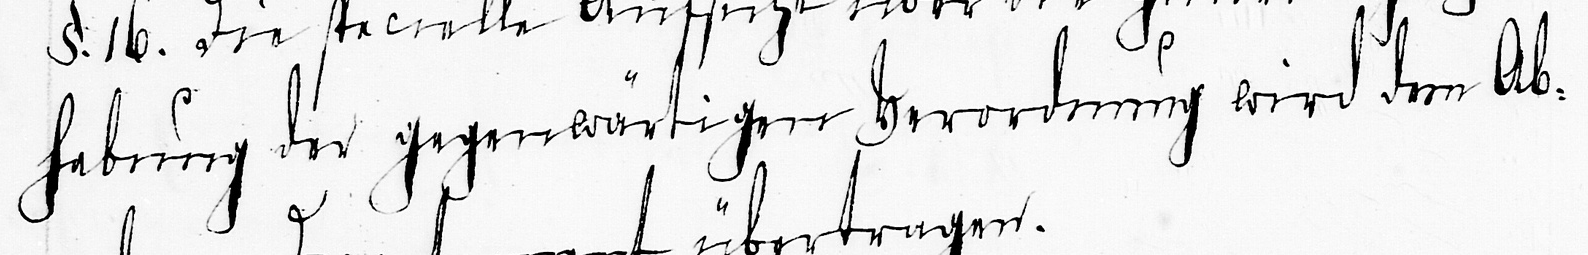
habung der gegenwärtigen Verordnung wird dem Ab¬
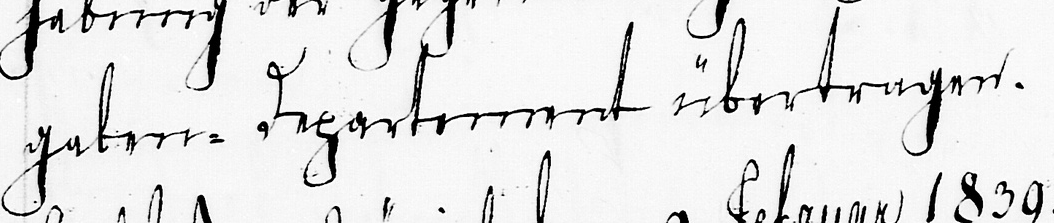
gaben-Departement übertragen.
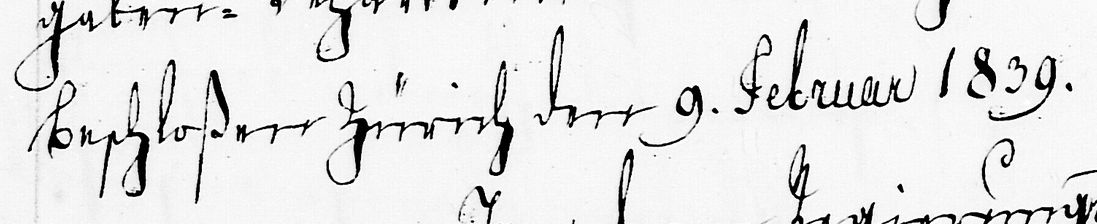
Beschloßen Zürich den 9. Februar 1839.
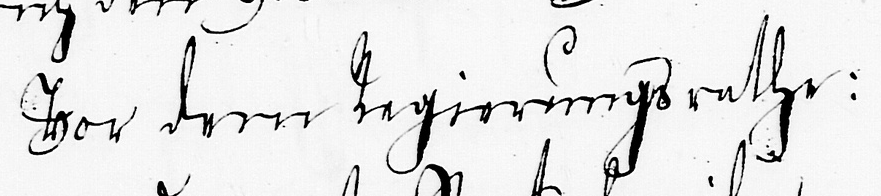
Vor dem Regierungsrathe:
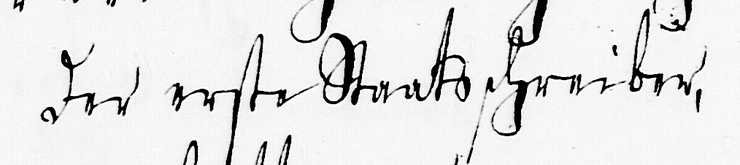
Der erste Staatsschreiber,
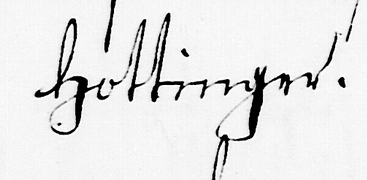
Hottinger.
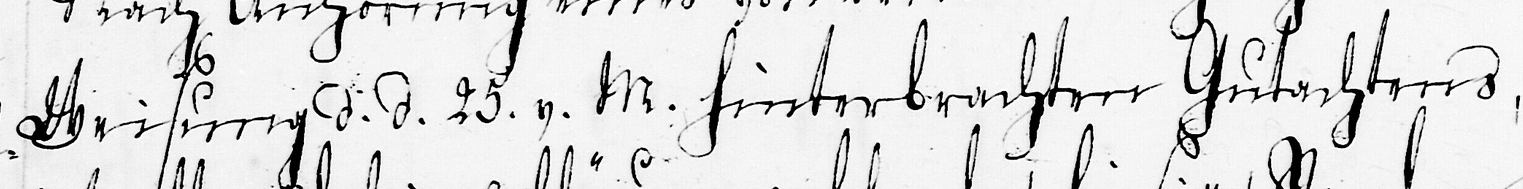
Weisung d. d. 25. v. M. hinterbrachten Gutachtens,
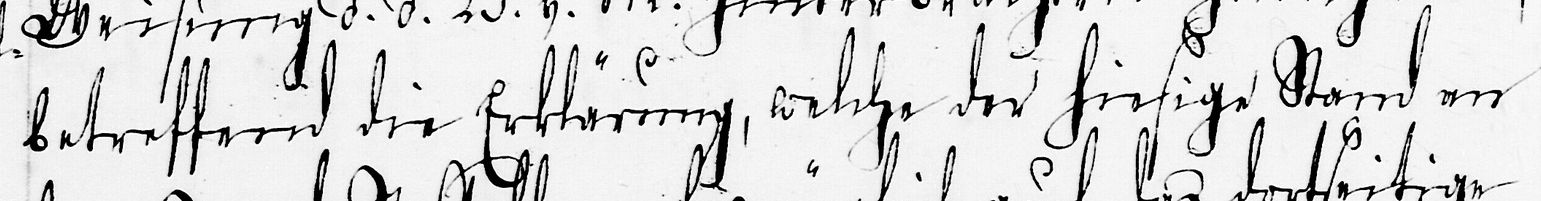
betreffend die Erklärung, welche der hiesige Stand an
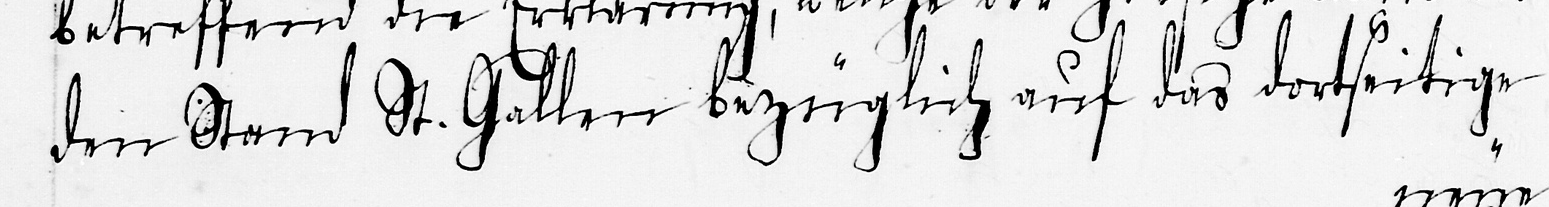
den Stand St. Gallen bezüglich auf das dortseitige
